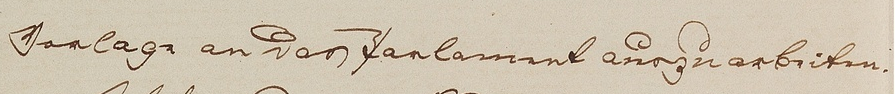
Vorlage an das Parlament auszuarbeiten.
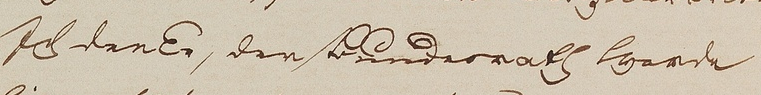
Ich denke, der Bundesrath werde
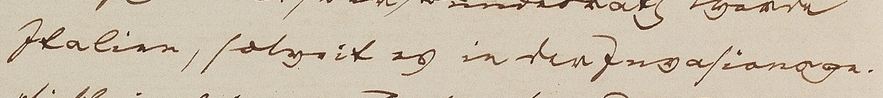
Italien, soweit es in der Invasionsge-
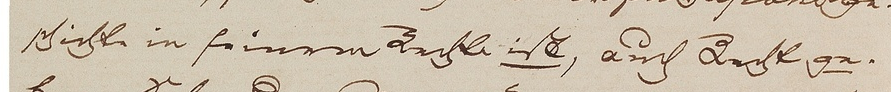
schichte in seinem Rechte ist, auch Recht ge-
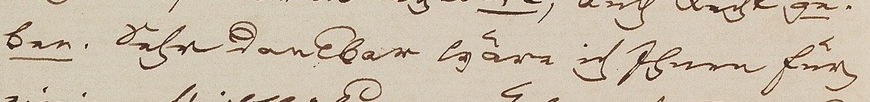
ben. Sehr dankbar wäre ich Ihnen für
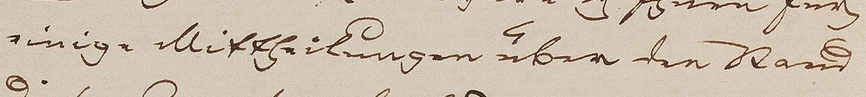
einige Mittheilungen über den Stand
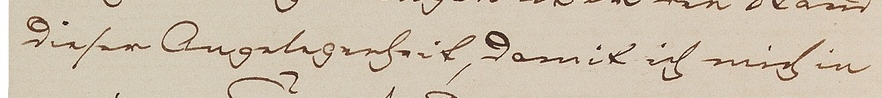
dieser Angelegenheit, damit ich mich in
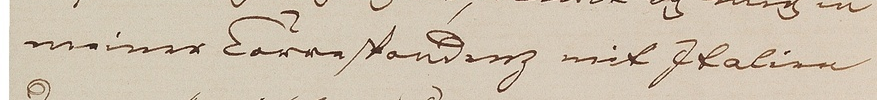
meiner Correspondenz mit Italien
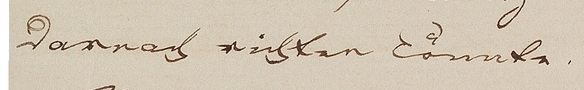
darnach richten könnte.
